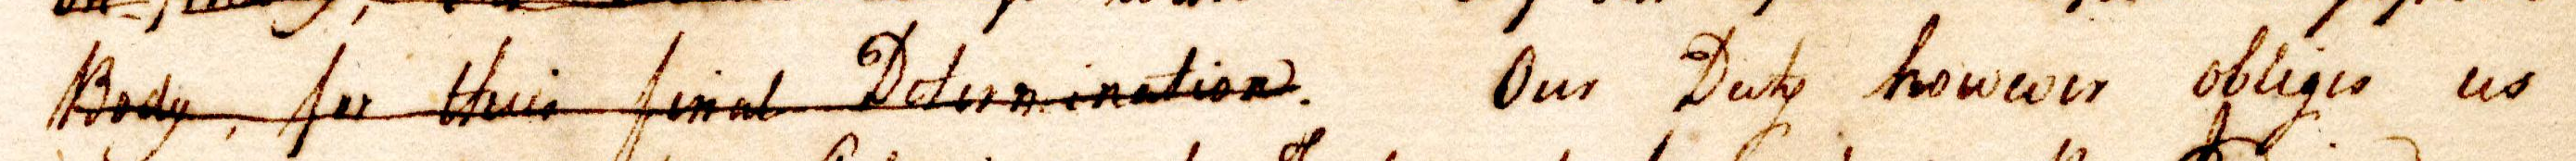Body, for this final Determination. Our Duty however obliges us
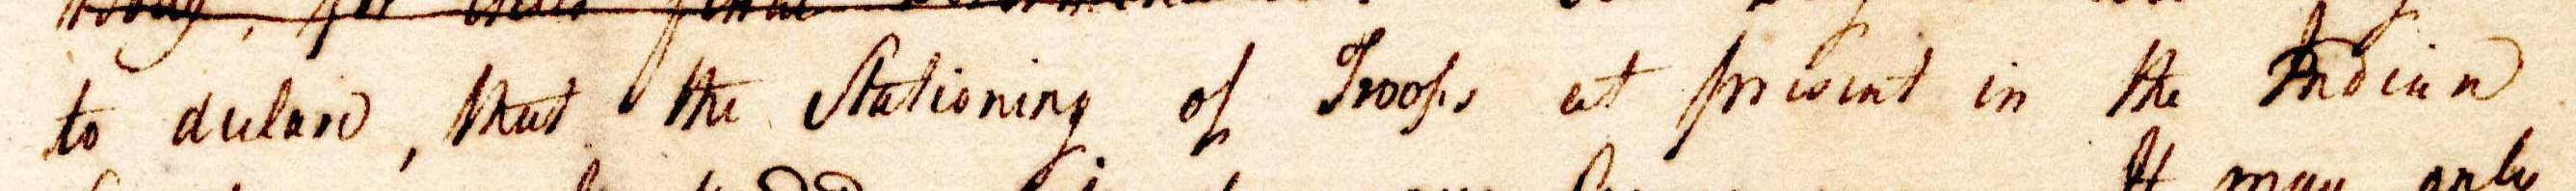to declare, that the Stationing of Troops at present in the Indian
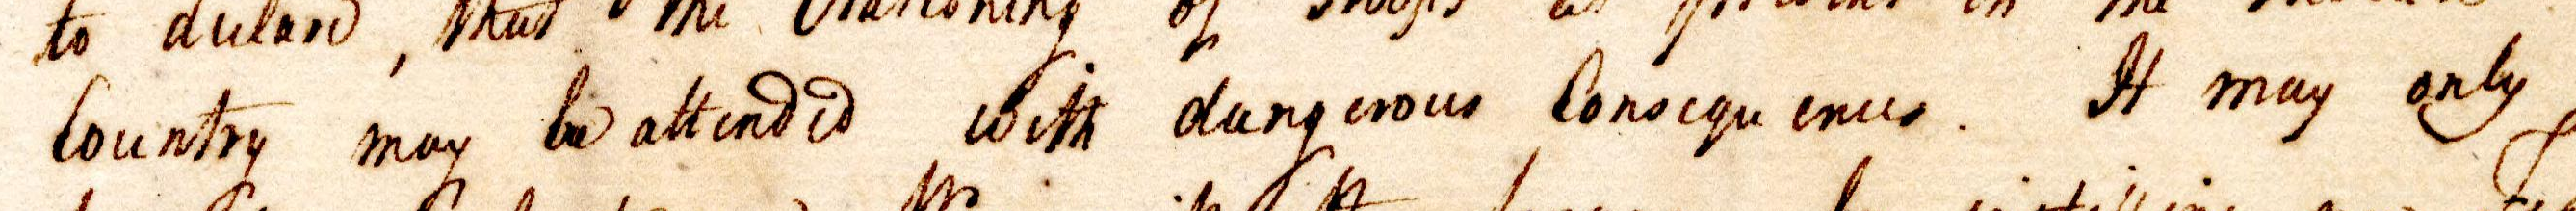Country may be attended with dangerous Consequences. It may only
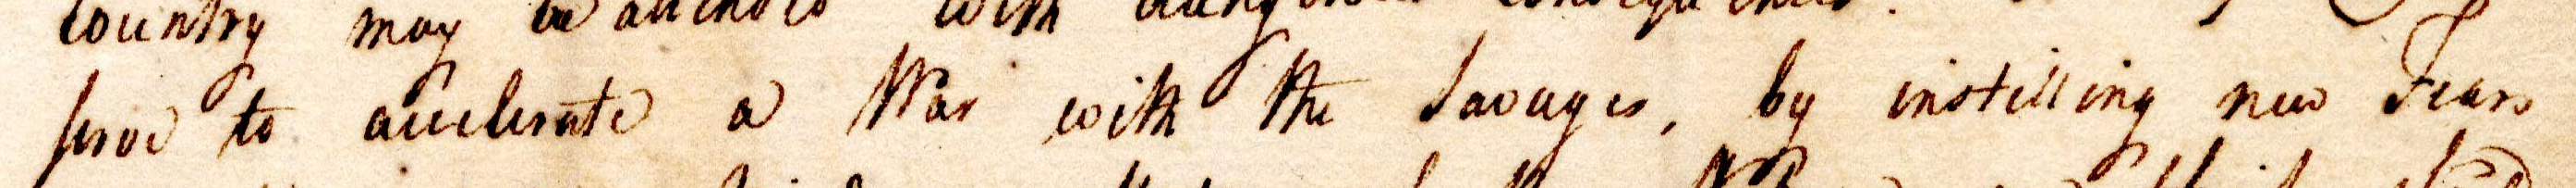serve to accelerate a War with the Savages, by instilling new Fears
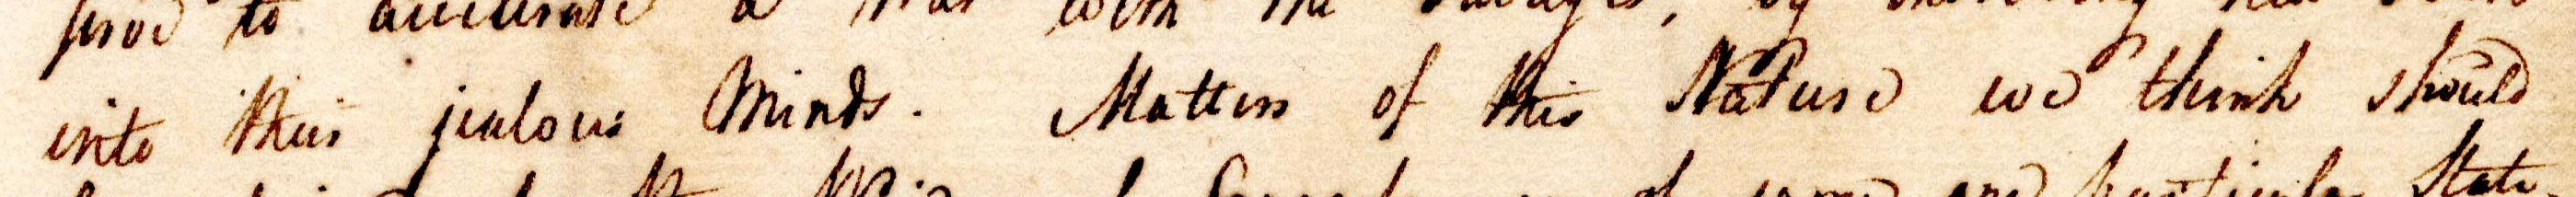into their jealous minds. Matters of this Nature we think should
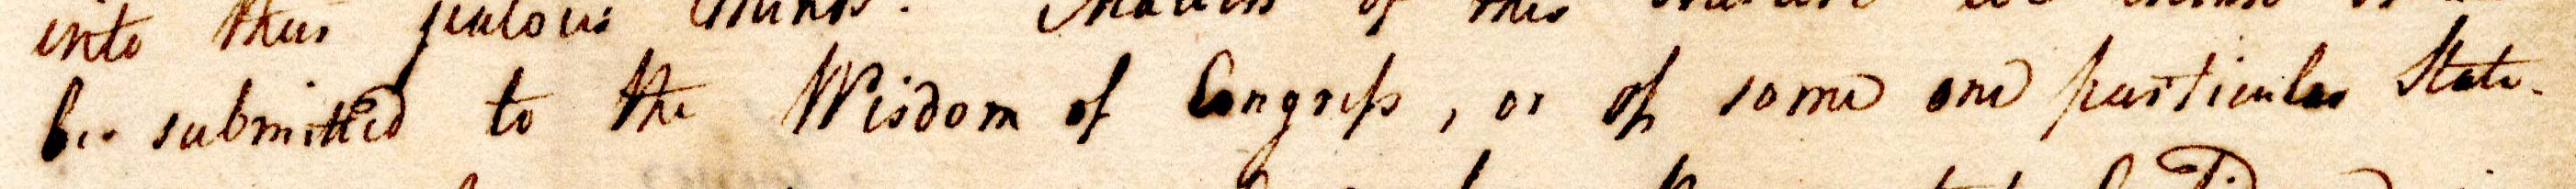be submitted to the Wisdom of Congress, or of some one particular State.
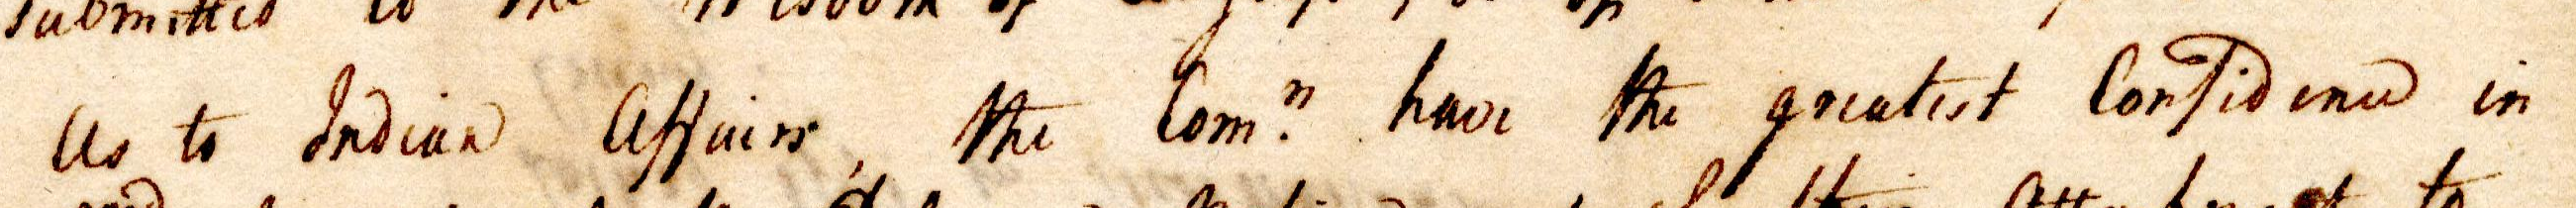As to Indian Affairs, the Com^r. have the greatest Confidence in
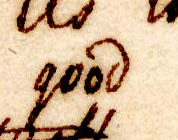good
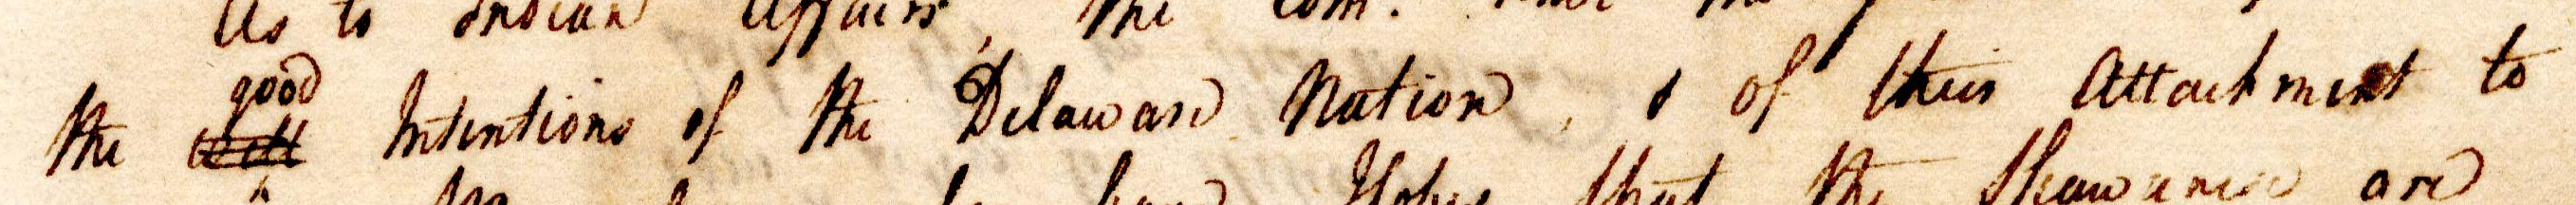the well ^ Intentions of the Delaware Nation, & of their Attachment to
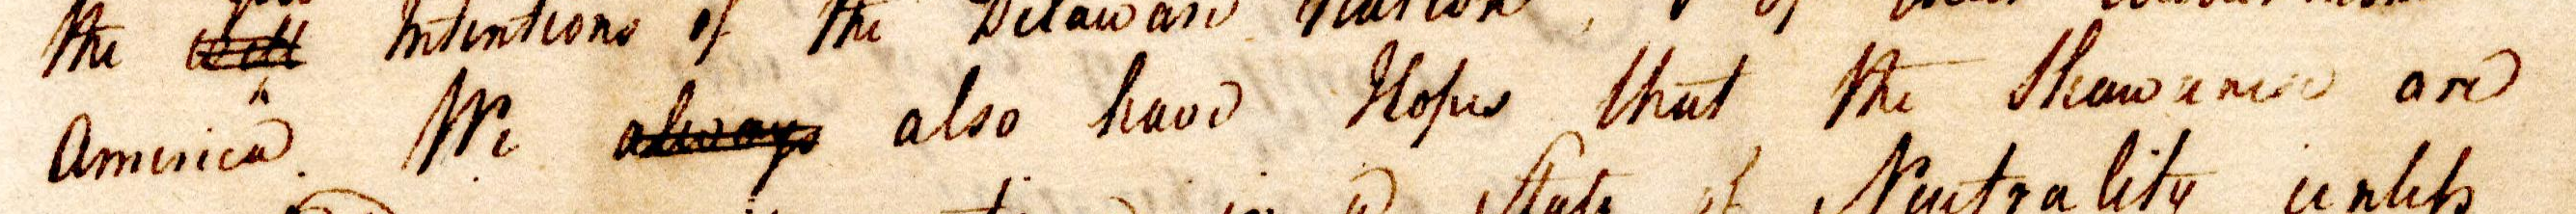America. We always also have Hopes that the Shawanese are
